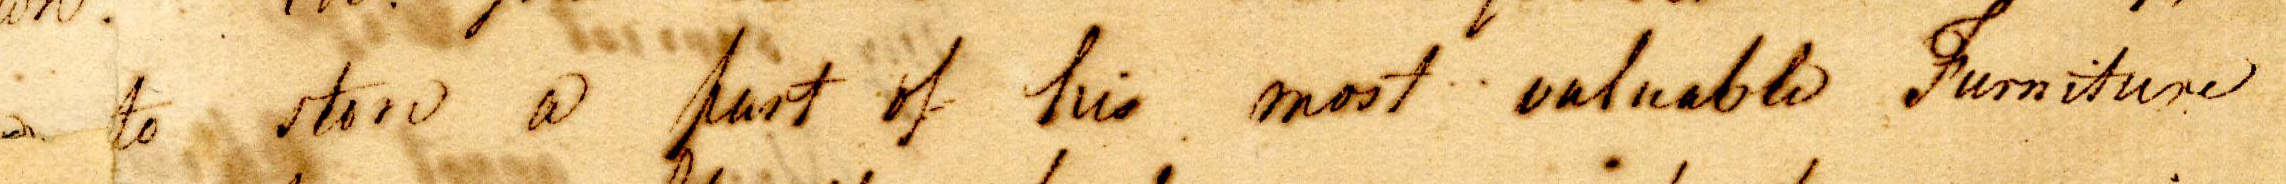to store a part of his most valuable Furniture
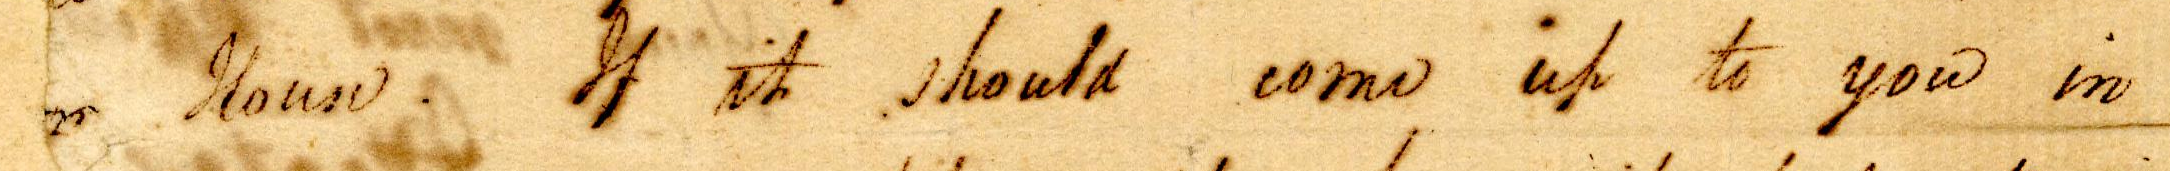n House. If it should come up to you in
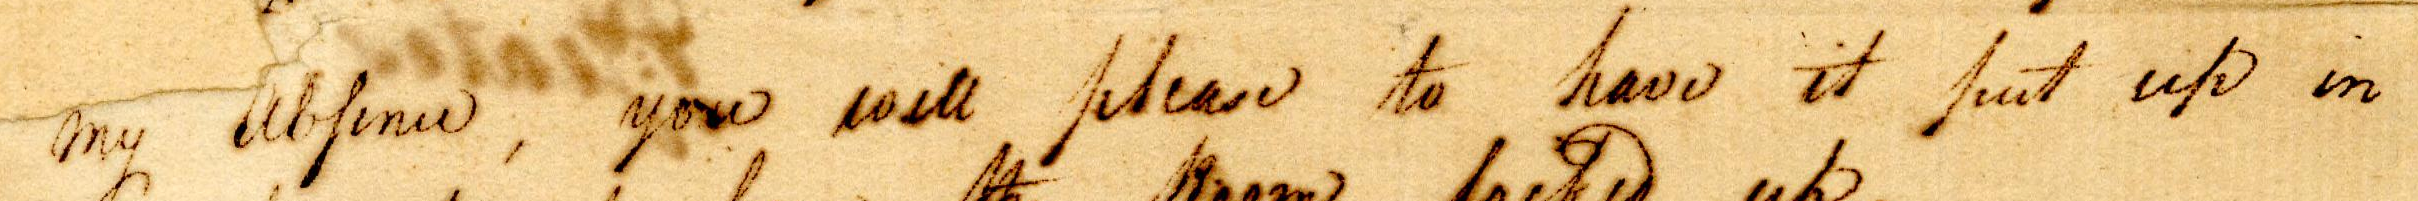my Absence, you will please to have it put up in
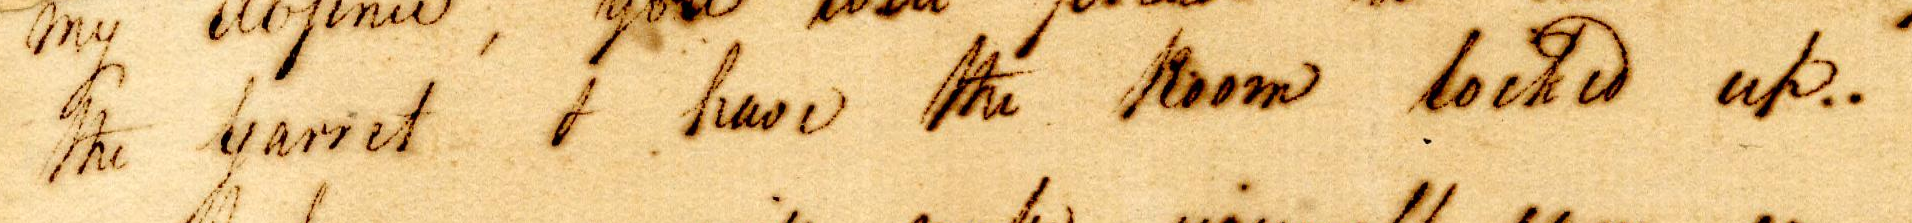the Garret & have the room locked up.
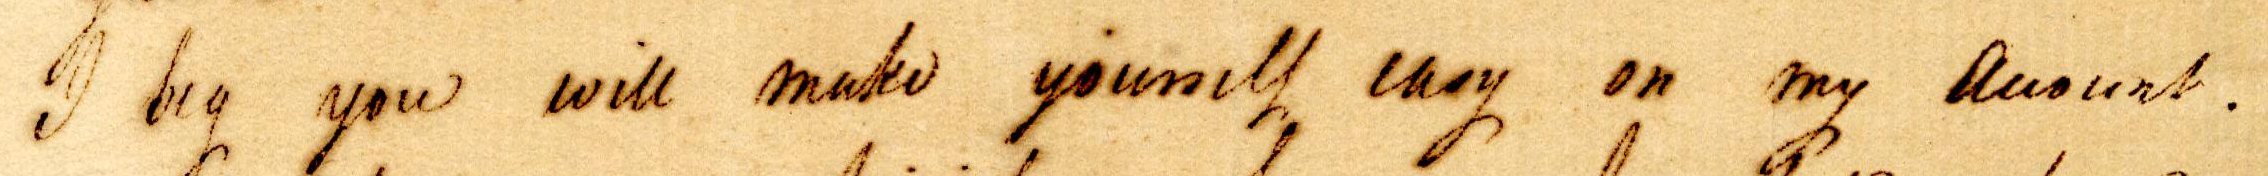I beg you will make yourself easy on my Account.
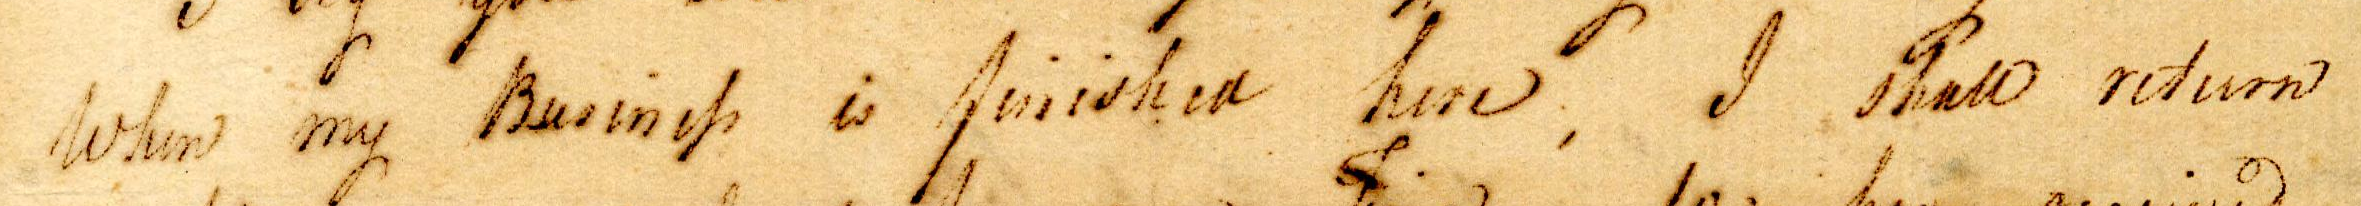When my Business is finished here, I shall return
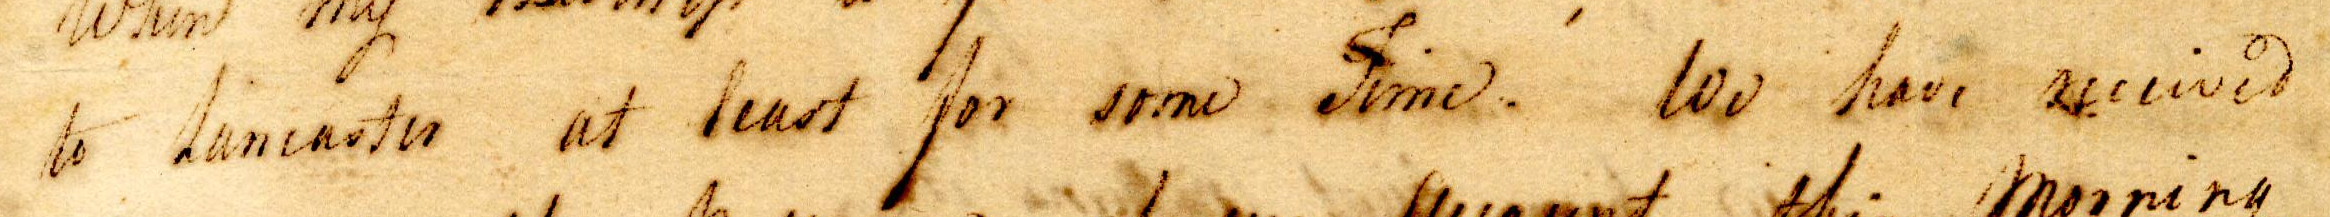to Lancaster at least for some Time. We have received
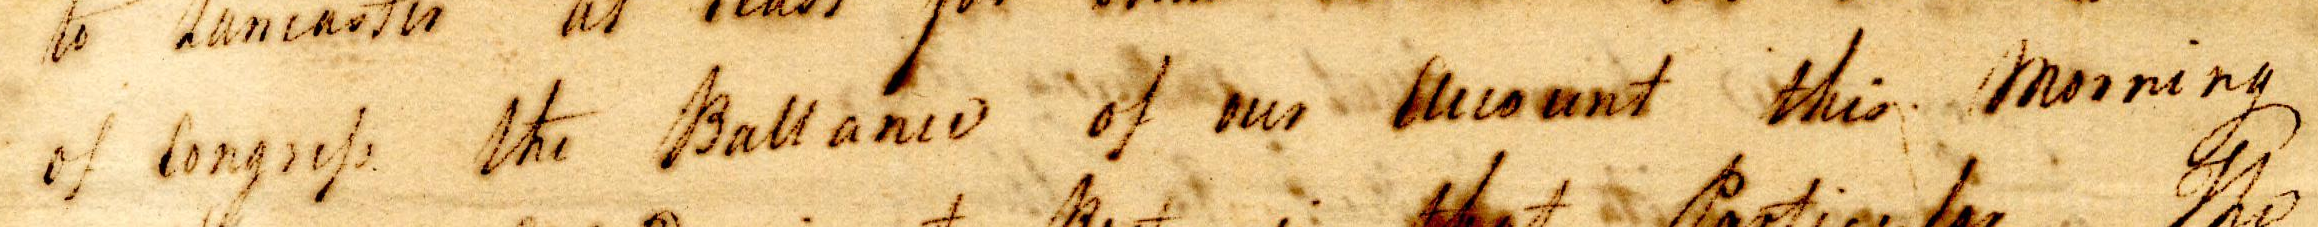of Congress the Ballance of our Account this Morning
